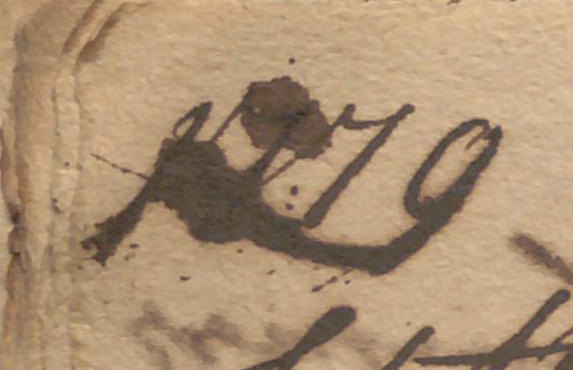1779
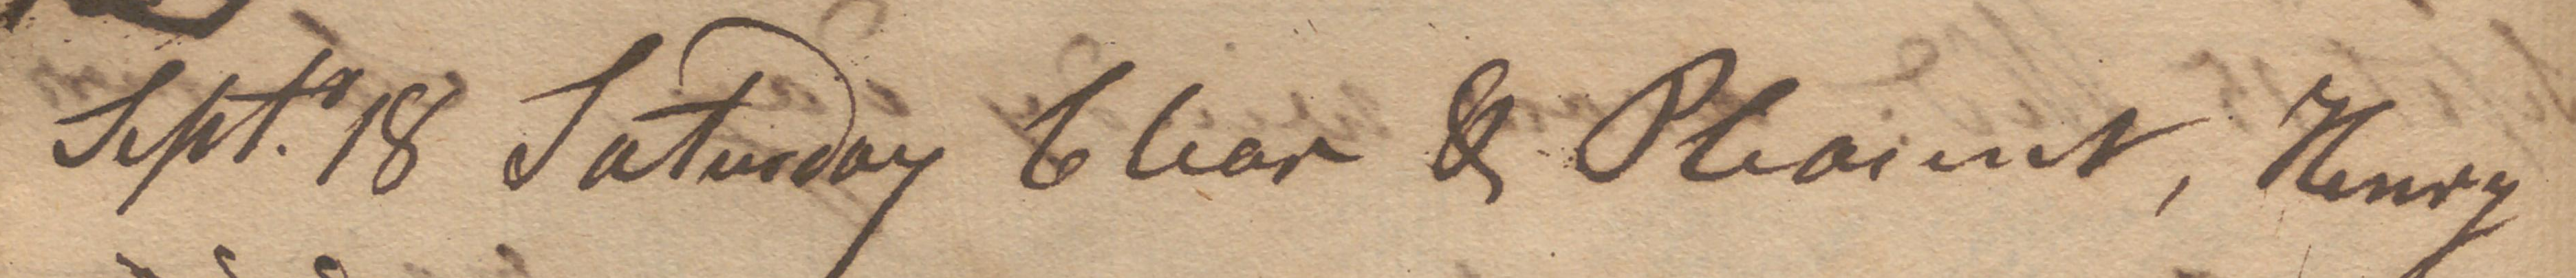Sept^r. 18 Saturday Clear & Pleasent, Henry
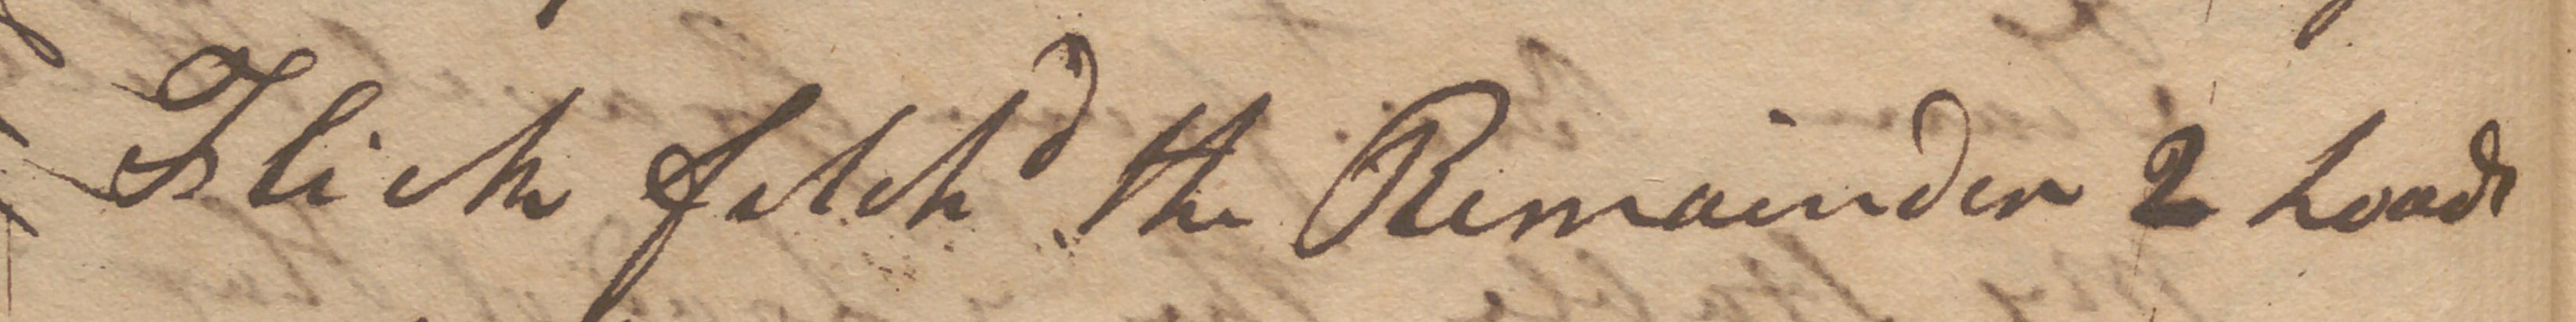Flick fetch^d the Remainder 2 Loads
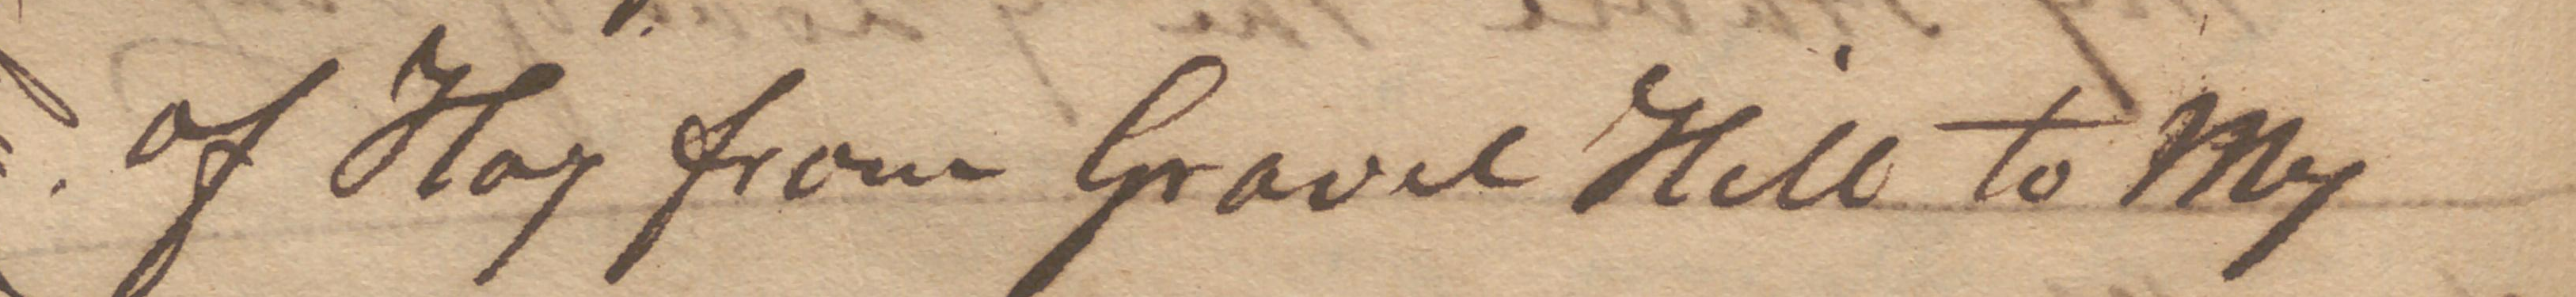of Hay from Gravel Hill to My
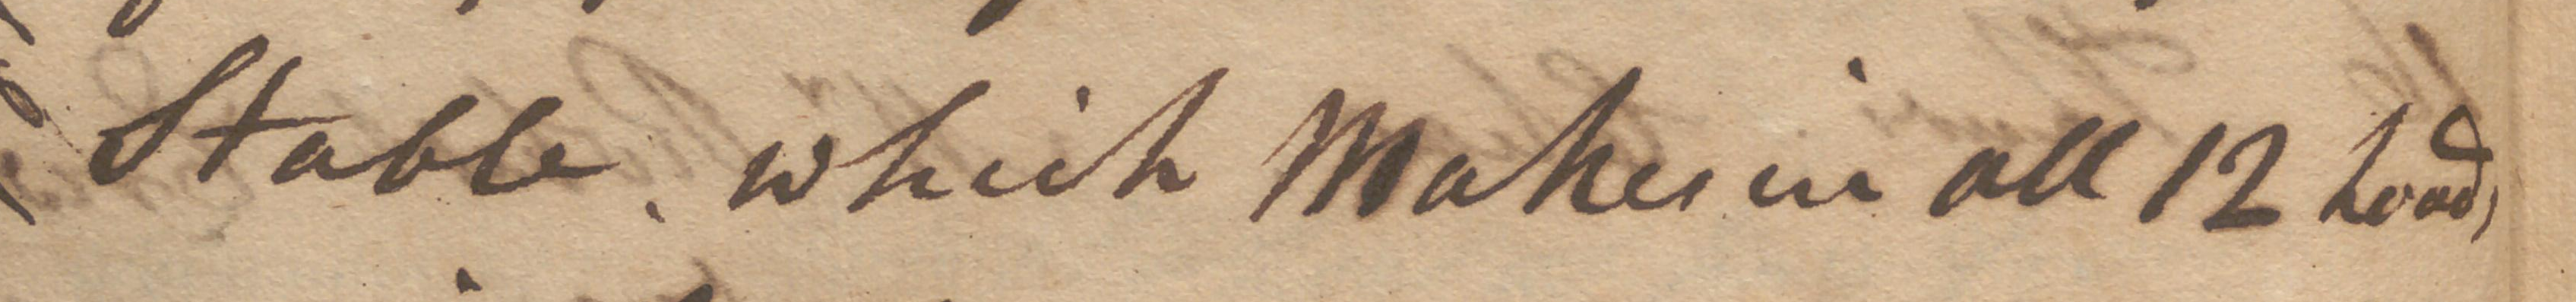Stable. which Makes in all 12 Loads
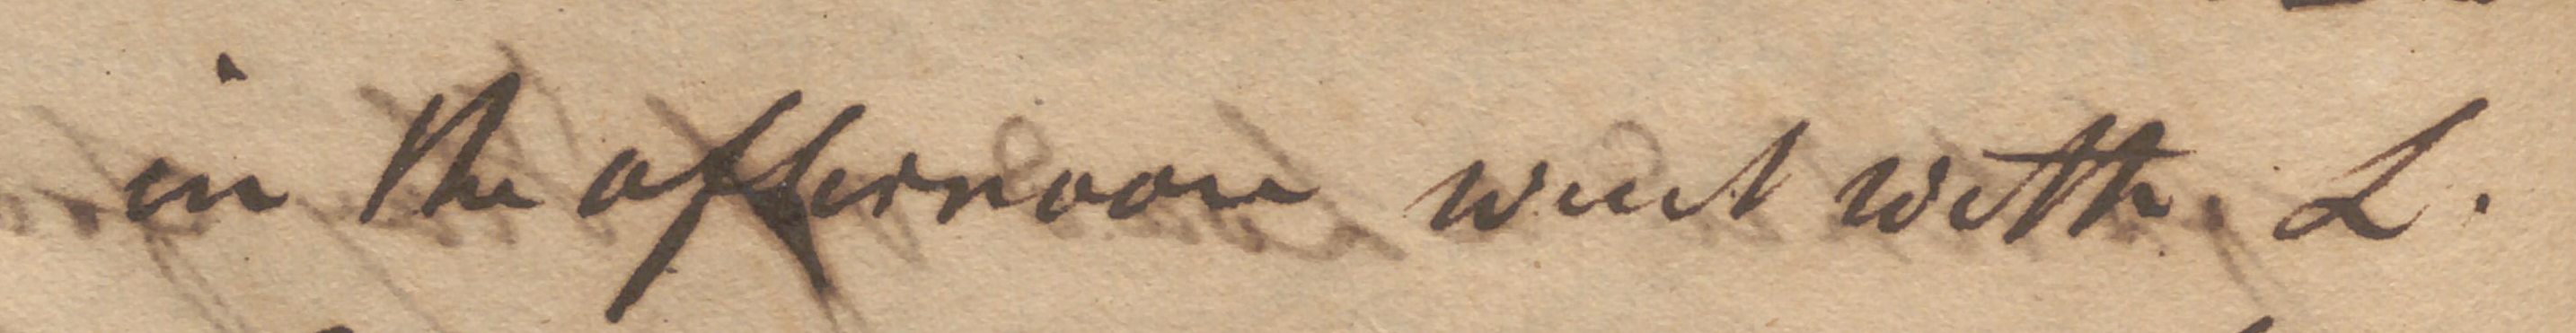in the afternoon went with L.
